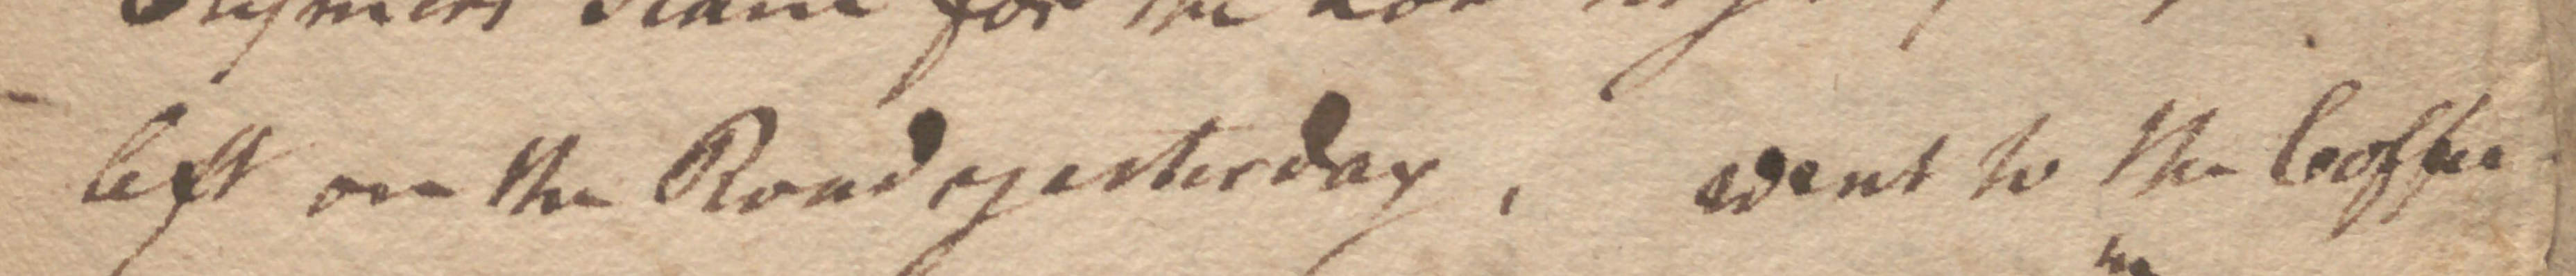left on the Road yesterday, went to the Coffee
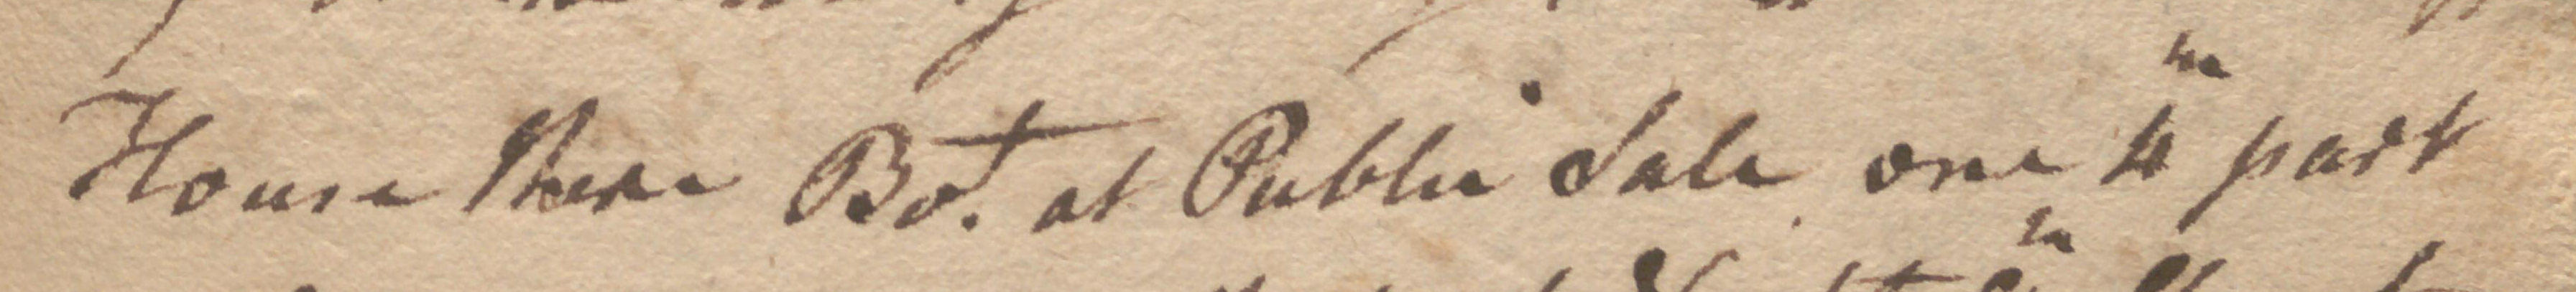House there Bo^t. at Public sale one 4^th part
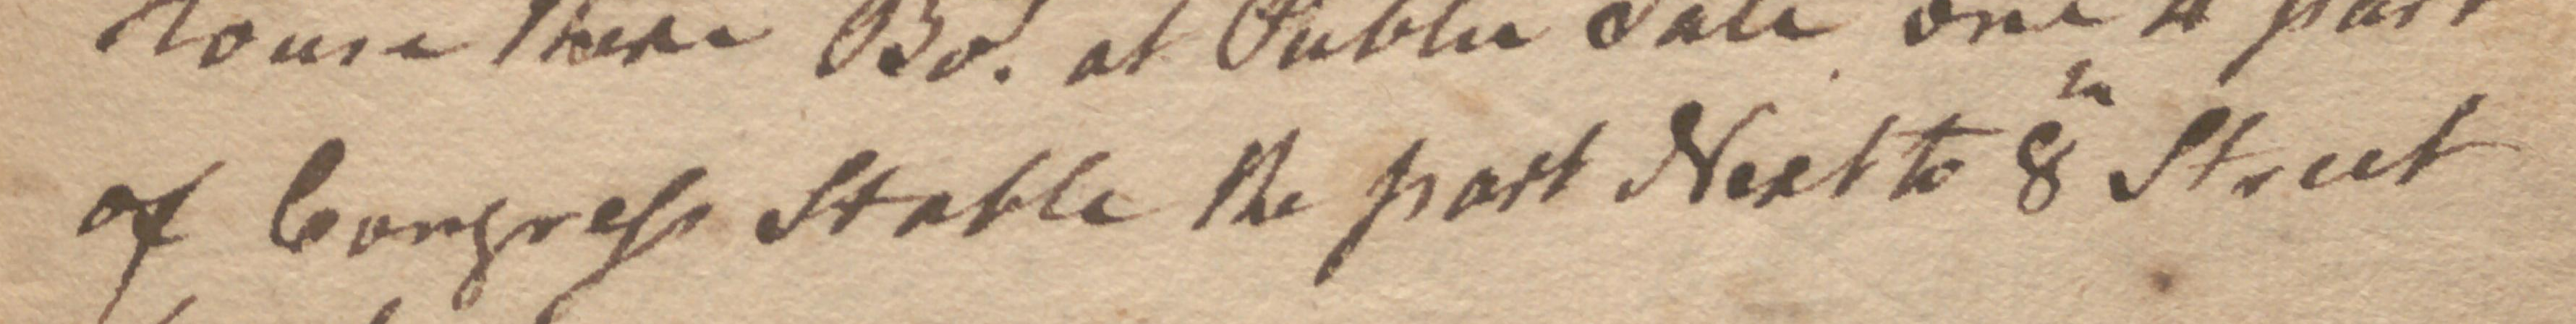of Congress Stable the past Next to 8^th Street
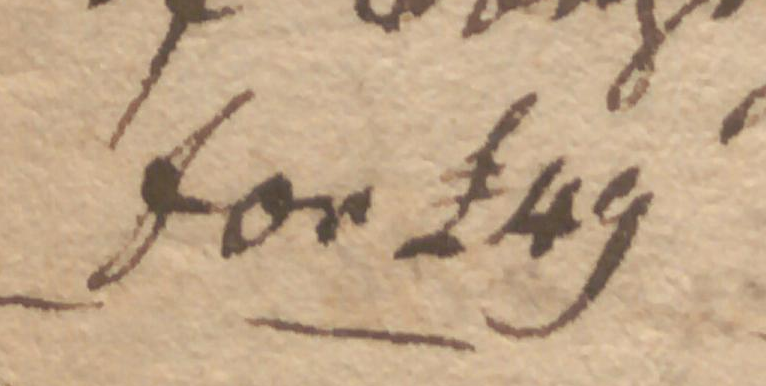For £49
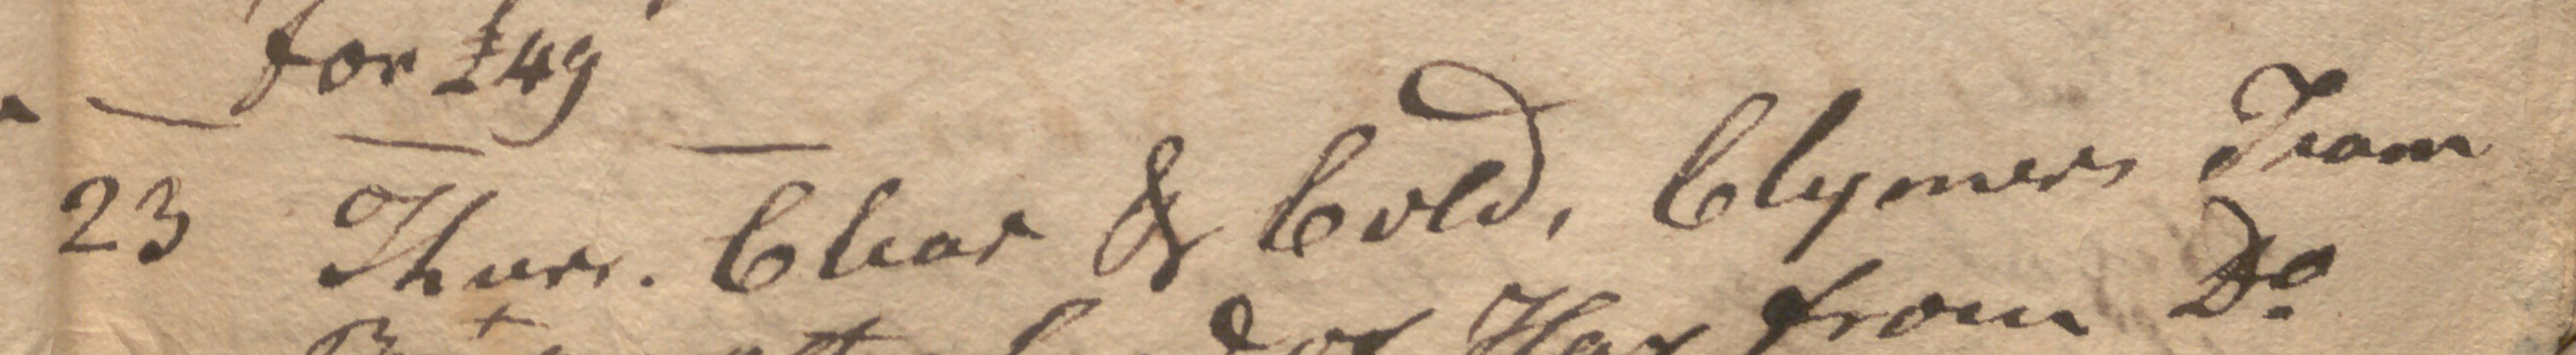23 Thurs. Clear & Cold. Clymers Team
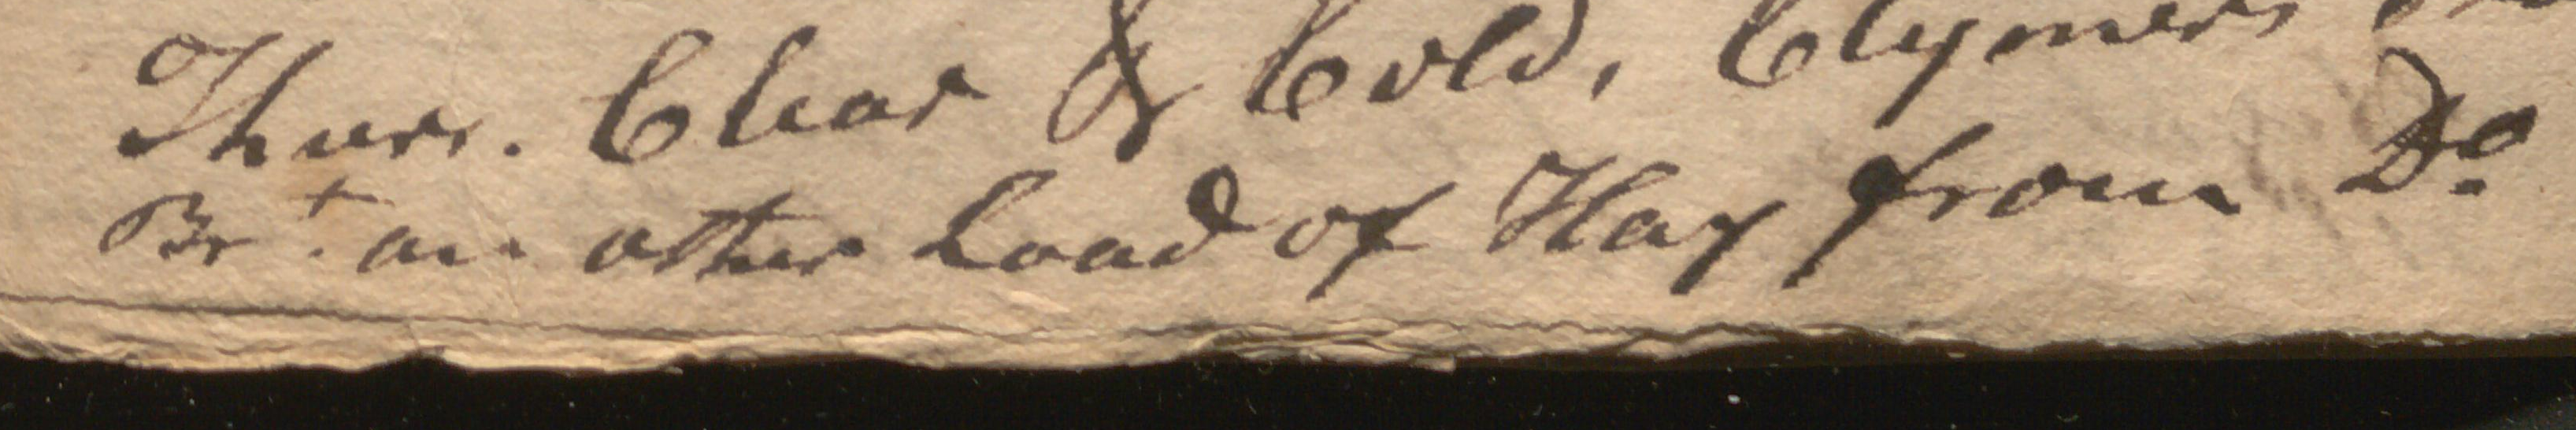Br^t. an other Load of Hay from D^o.
